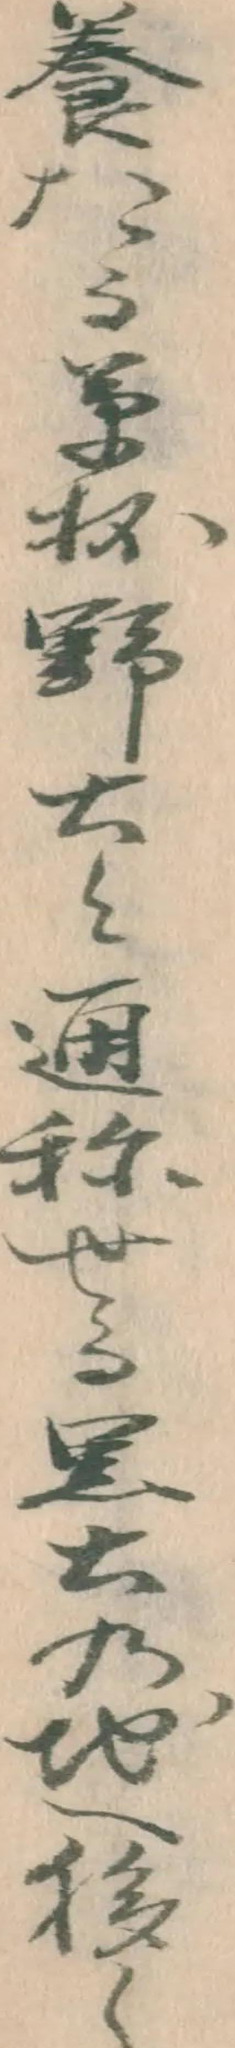養たる草抔野土と通称せる黒土の地へ移し

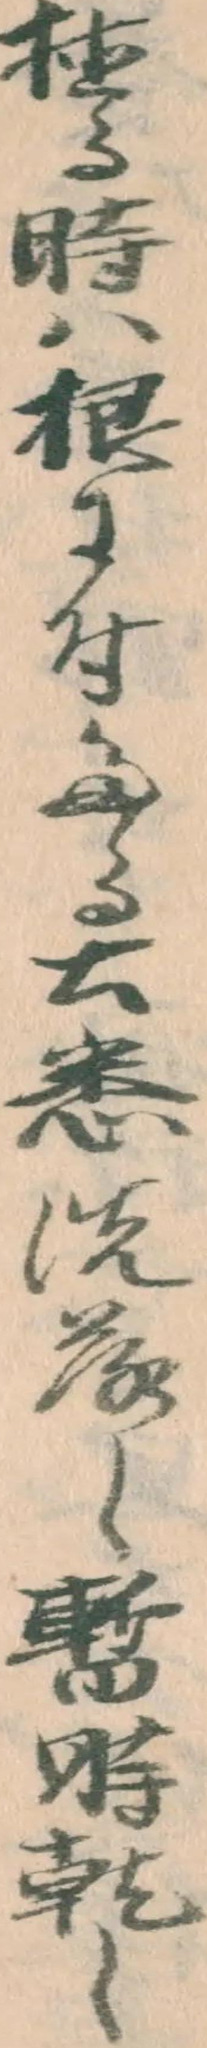植る時は根に付たる土悉洗落し暫時乾し
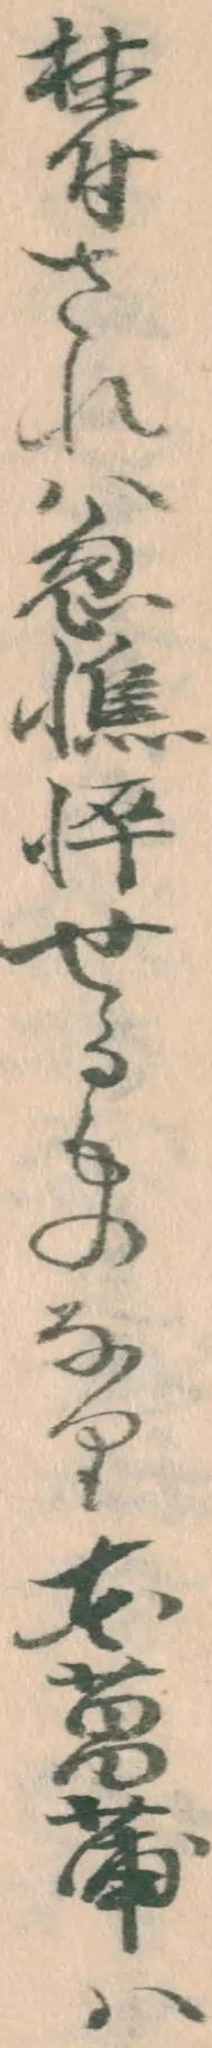植付されは忽憔悴せるものなり花菖蒲は
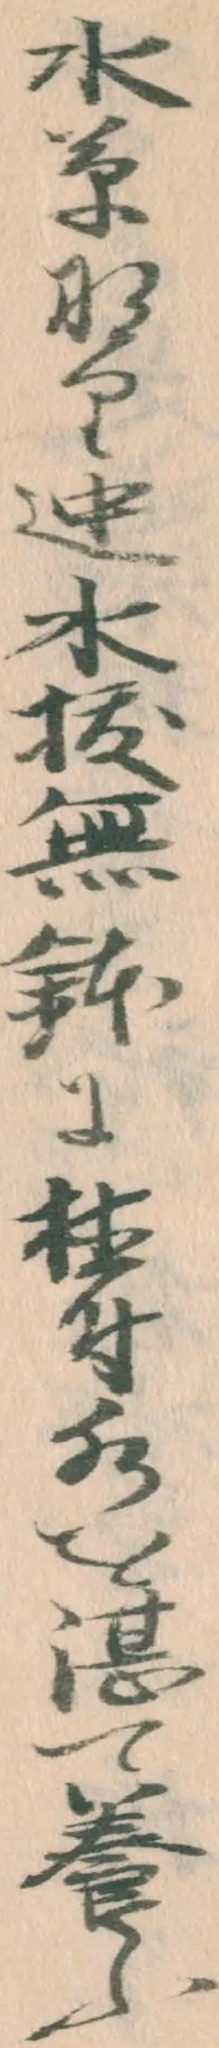水草なり迚水抜無鉢に植付水を湛て養ふ
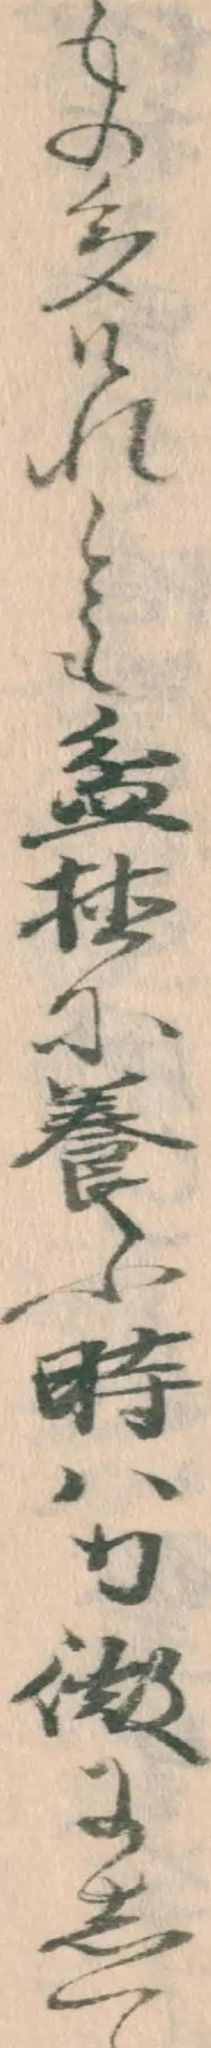もの多けれとも盆植に養ふ時は力微にして
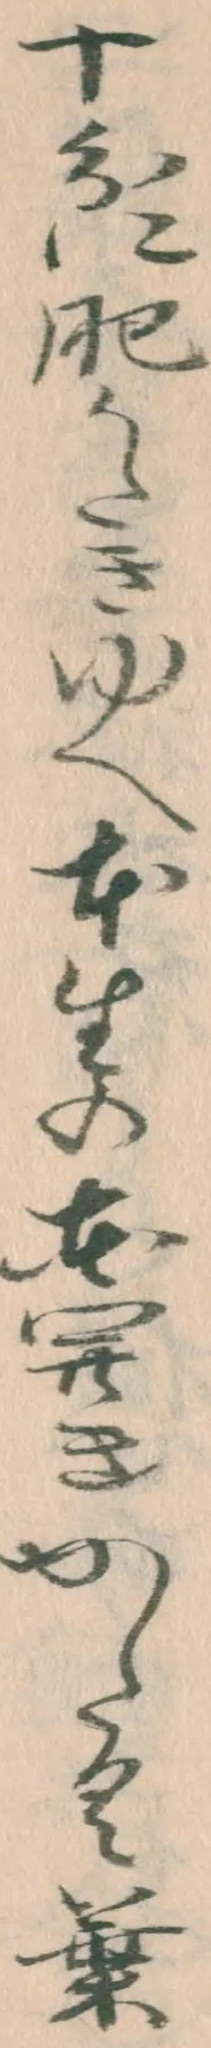十分に肥かたきゆへ本生の花開きかたく葉
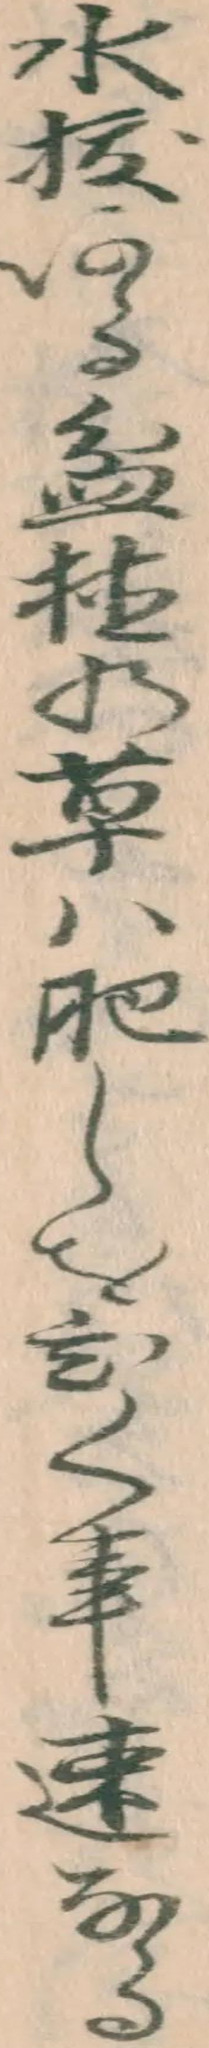水抜ある盆植の草は肥しをひく事速なる
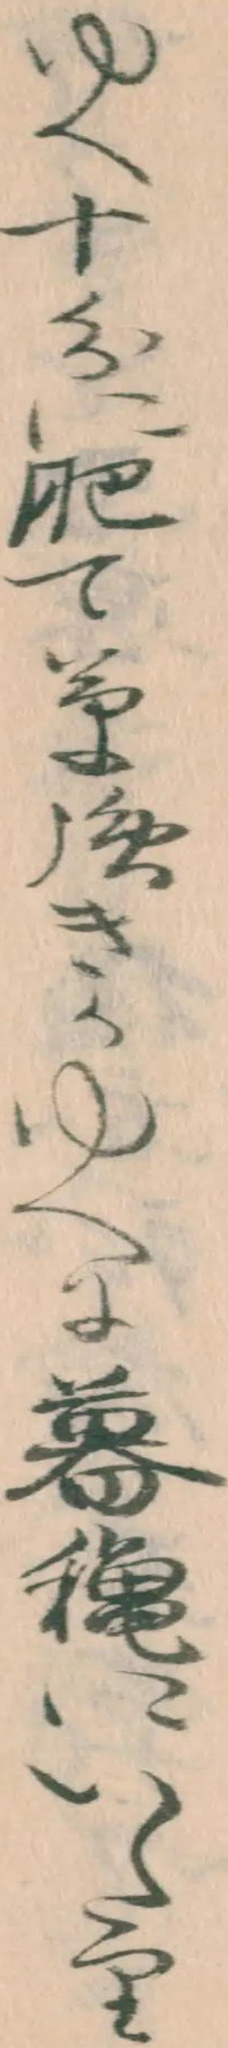ゆへ十分に肥て草強きかゆへに暮秋にいたり
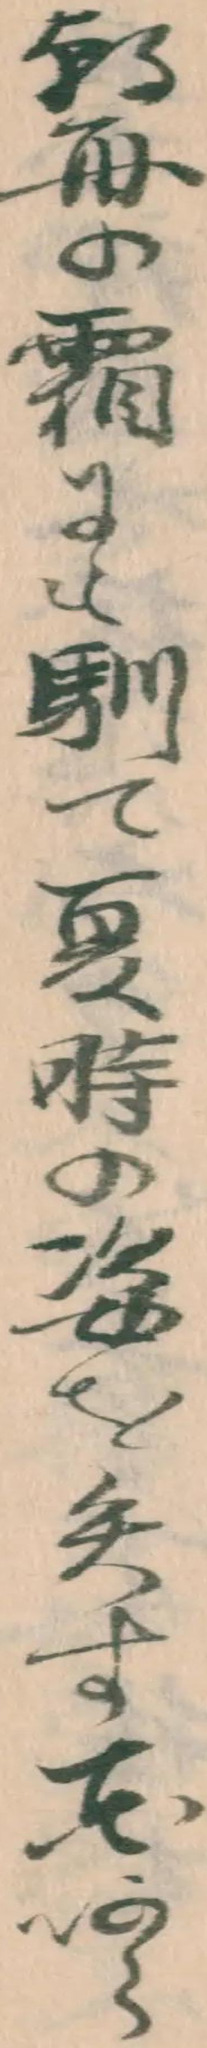朝毎の霜にも馴て夏時の姿を失す花あら
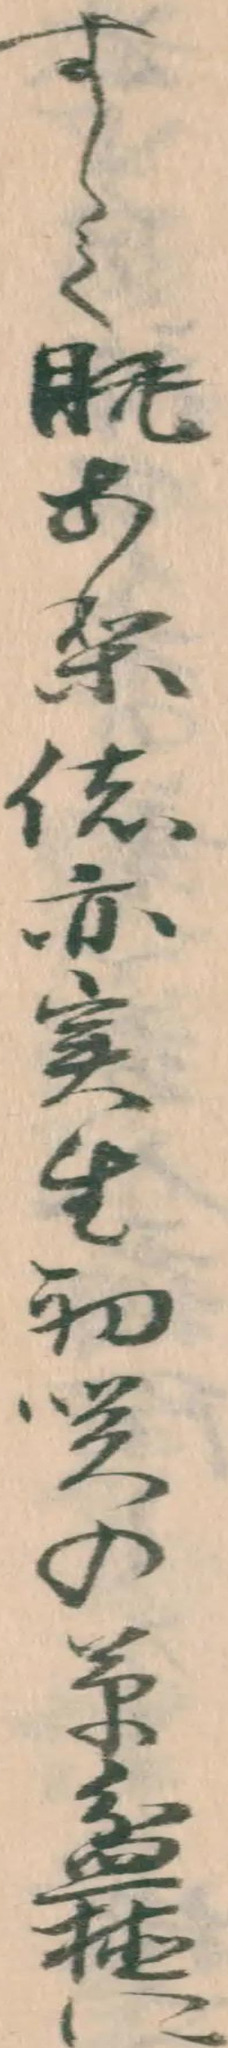すして眺あり偖亦実生初咲の草盆植に
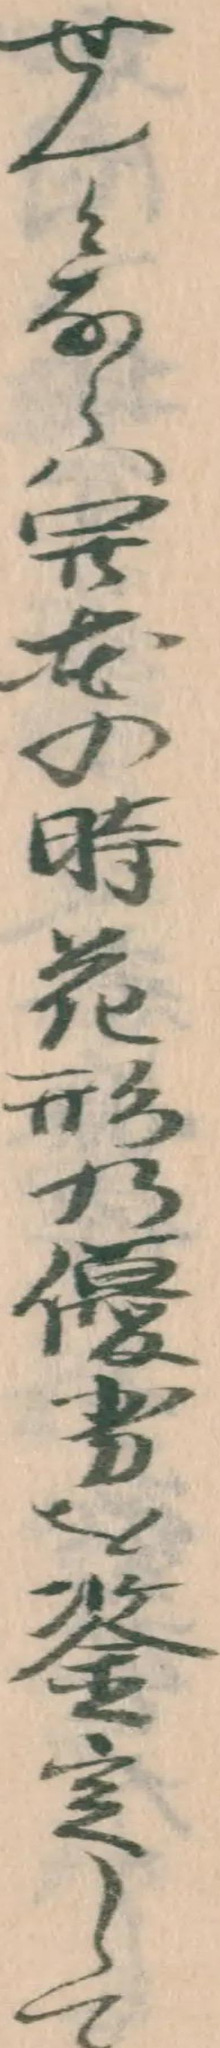せんとならハ開花の時花形の優劣を鑑定して
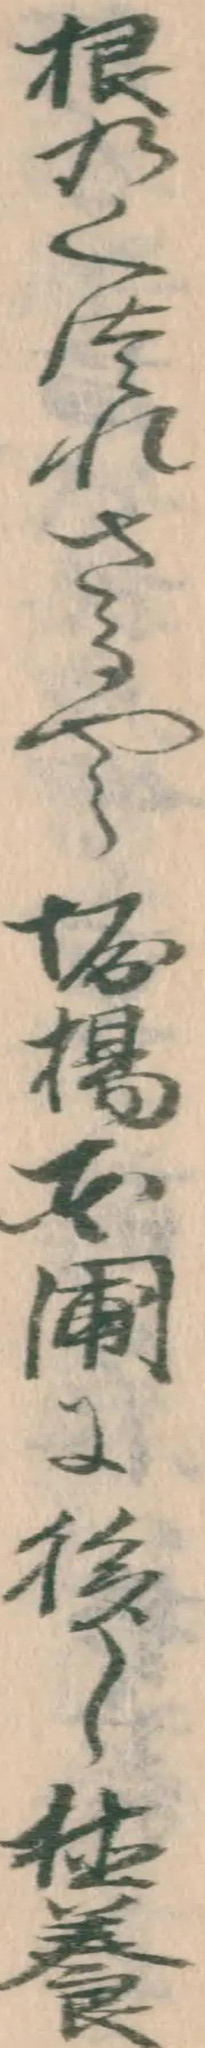根のくされさるやう掘揚花圃に移し植養
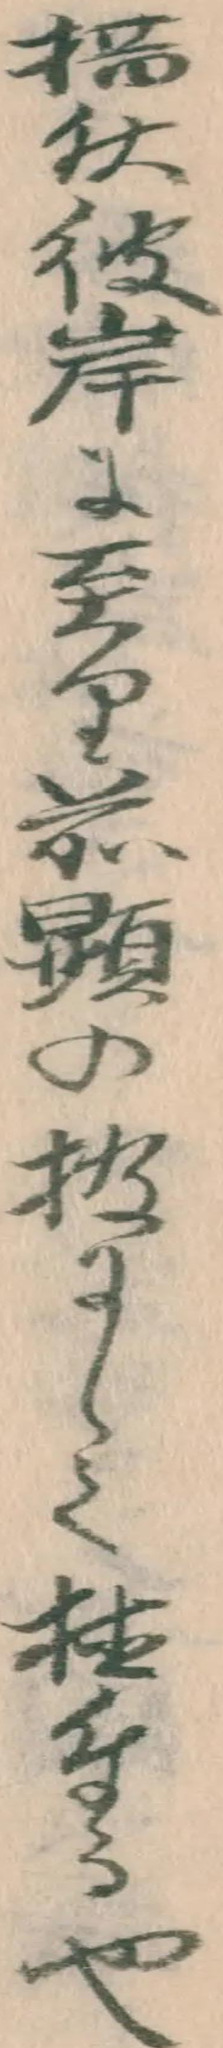措伏彼岸に至り前顕の扱いにして植付る也
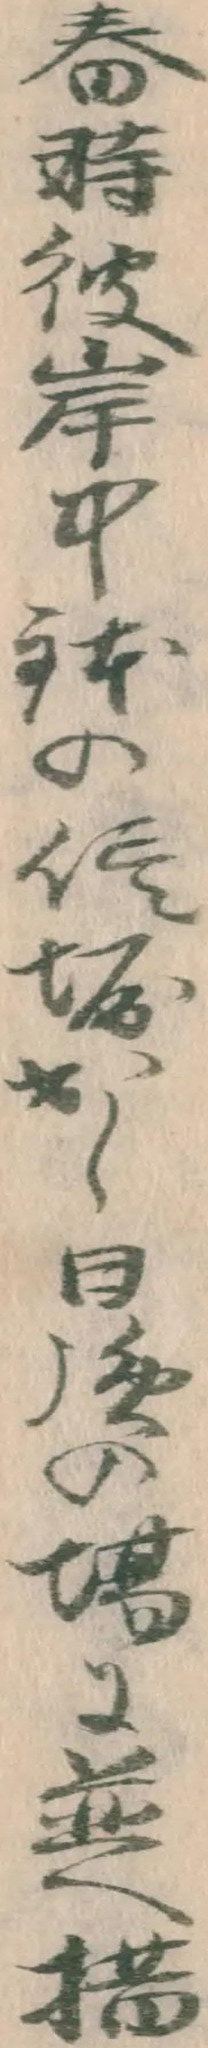春時彼岸中鉢の侭堀出し日強の場に並へ措
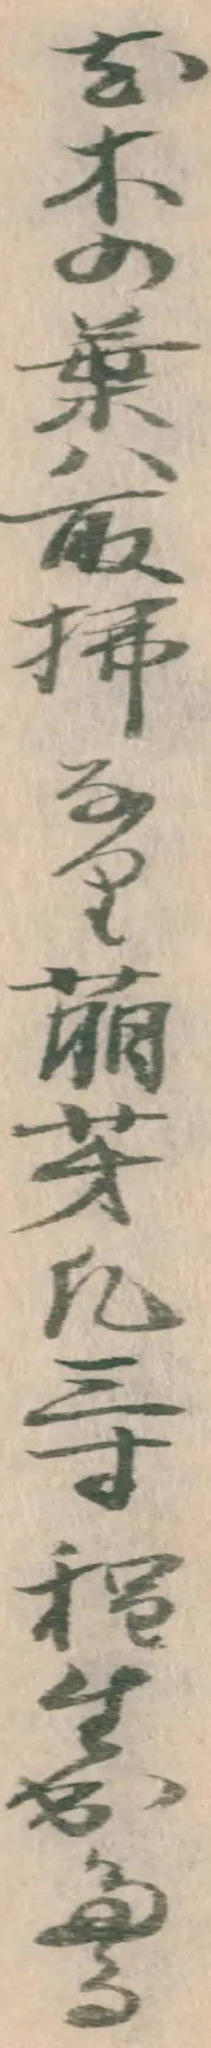尤木の葉ハ取掃なり萌芽凡三寸程生出たる
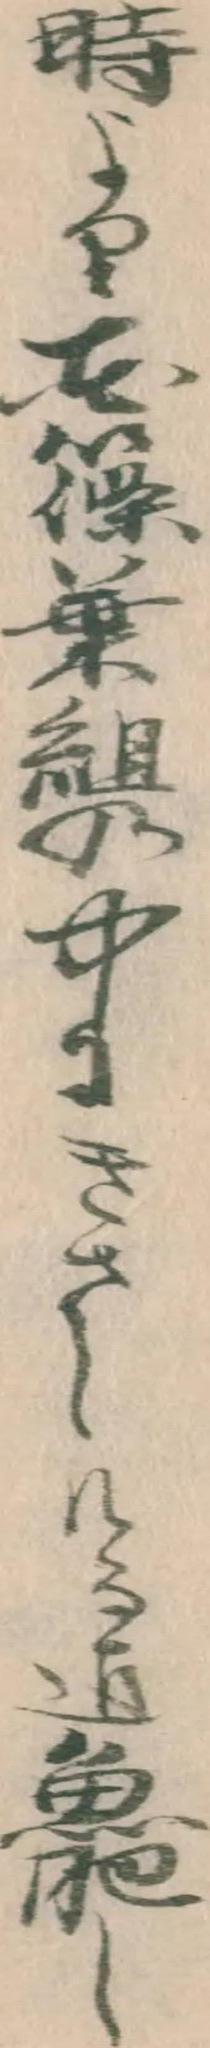時より花篠葉組の中にきさしける迠魚肥し
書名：花菖培養録
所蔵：国立国会図書館 National Diet Library, JAPAN
